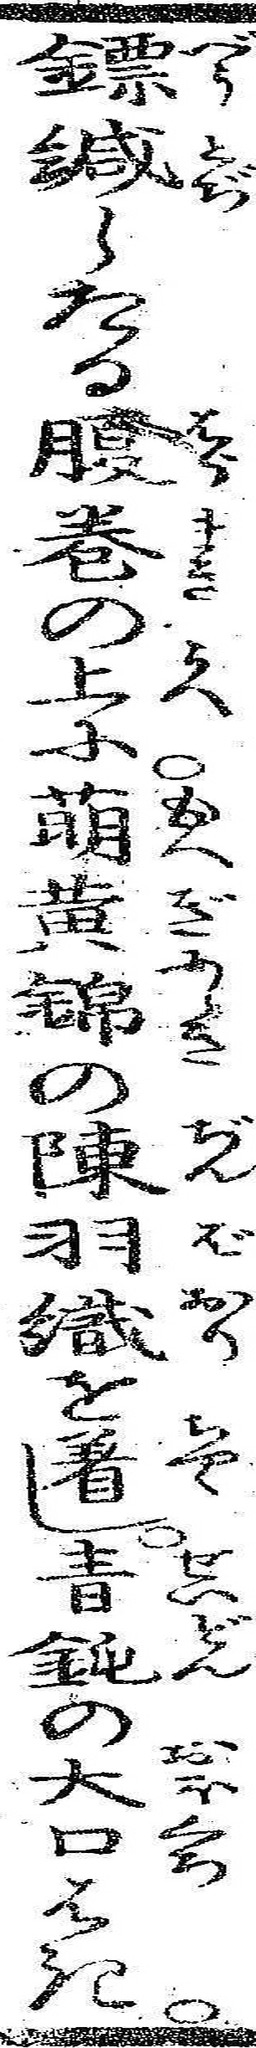鏢緘したる腹巻の上に。萌黄錦の陳羽織を着し。青鈍の大口はき。

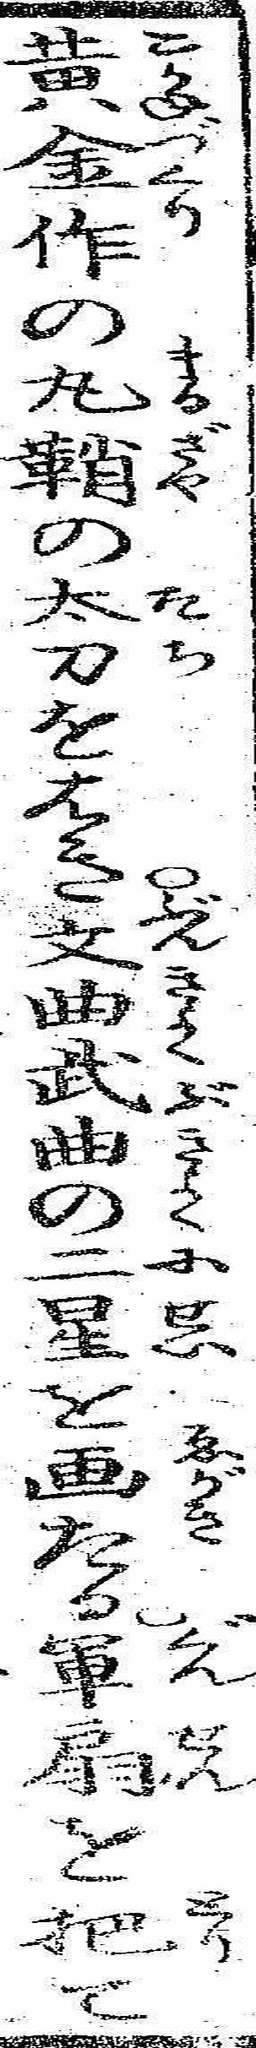黄金作の丸鞘の太刀をはき。文曲武曲の二星を画たる。軍扇を把て
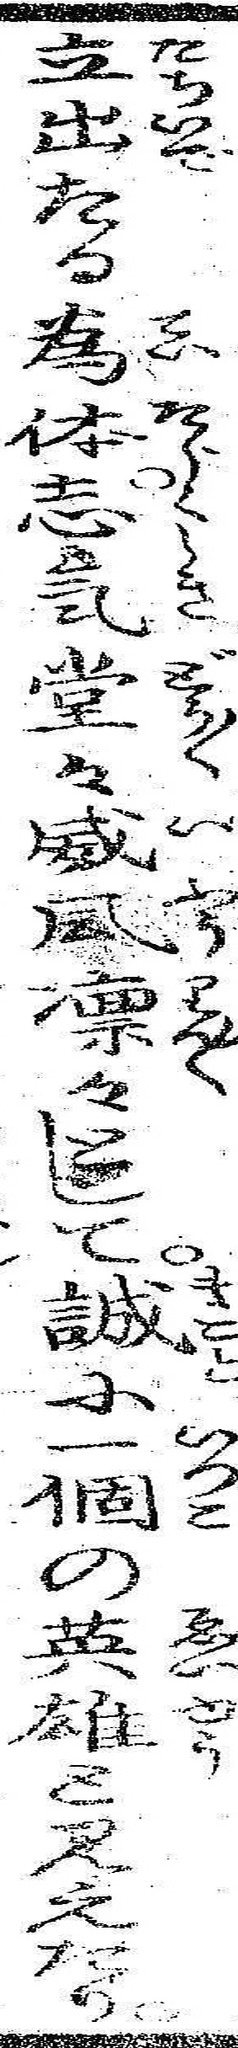立出たる為体。志気堂々威風凛々として。誠に一個の英雄と見えたり。
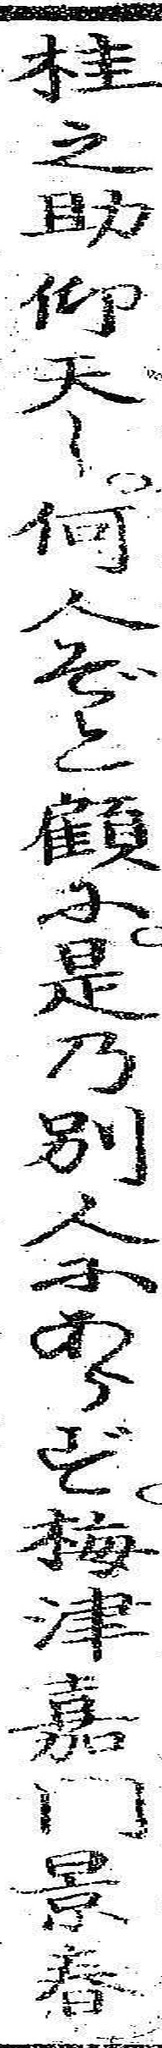桂之助仰天し。何人ぞと顧に。是乃別人にあらず。梅津嘉門景春
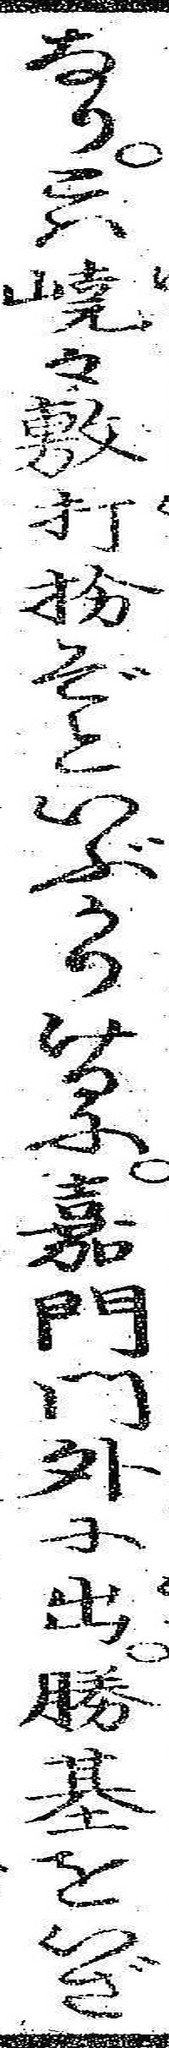なり。こは嶢々敷打扮ぞといぶかりけるに。嘉門門外に出。勝基をいざ
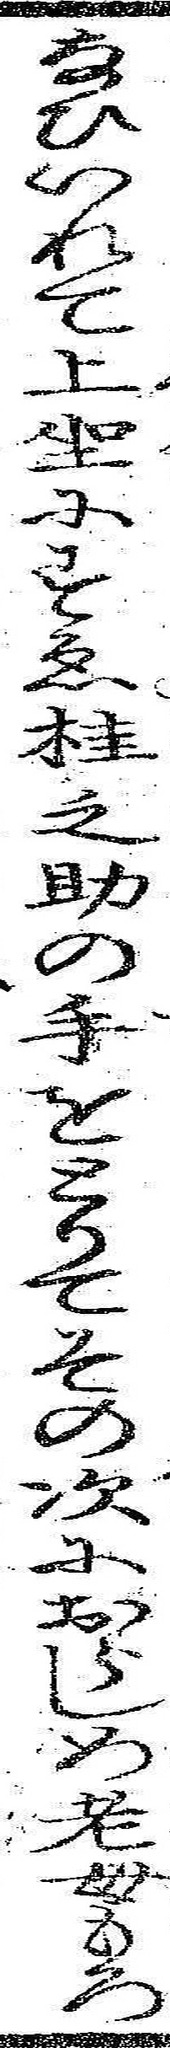なひいれて上坐にすゑ。桂之助の手をとりてその次におらしめ。老母もろ
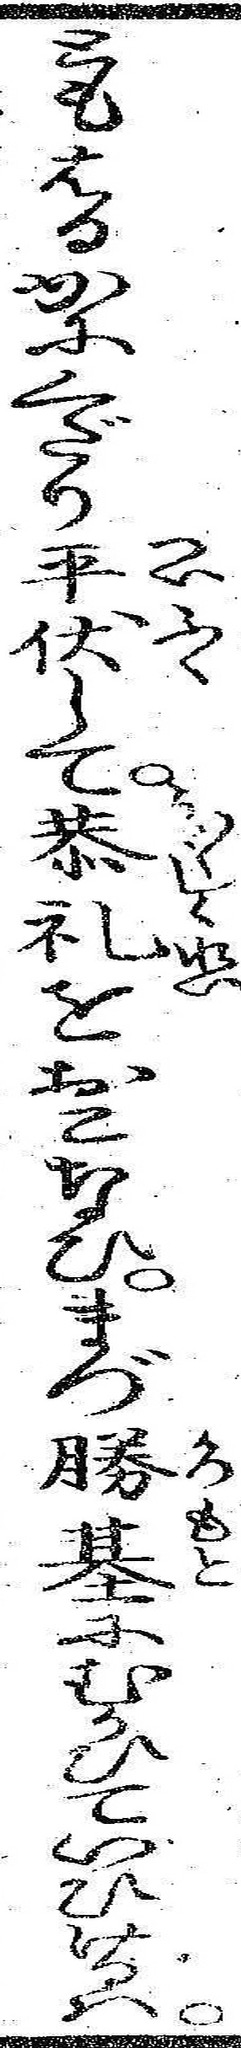ともはるかにくだり平伏して。恭礼をおこなひ。まづ勝基にむかひていひけるは。
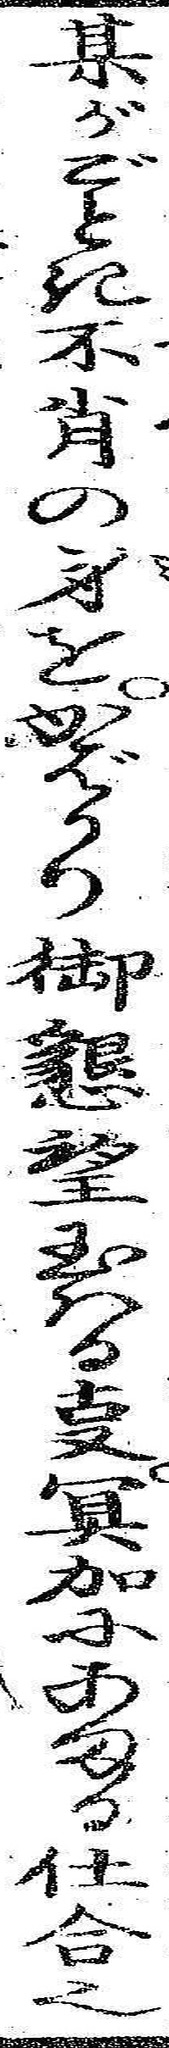某がごとき不肖の身を。かばかり御懇望玉はる事。冥加にあまる仕合也。
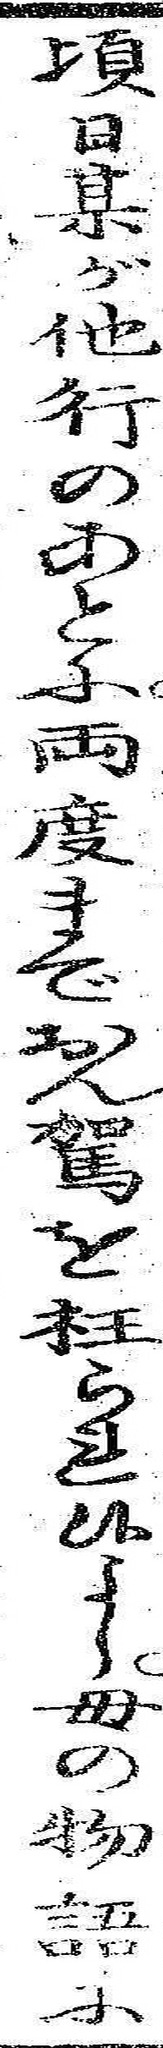頃日某が他行のあとに。両度までおん駕を枉られ候よし。母の物語に
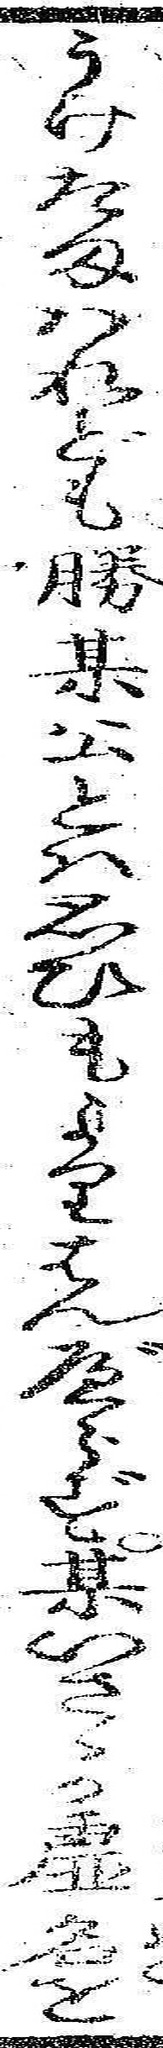うけたまはれども。勝基公とは思ひもよりはんべらず。某いさゝか虚名を
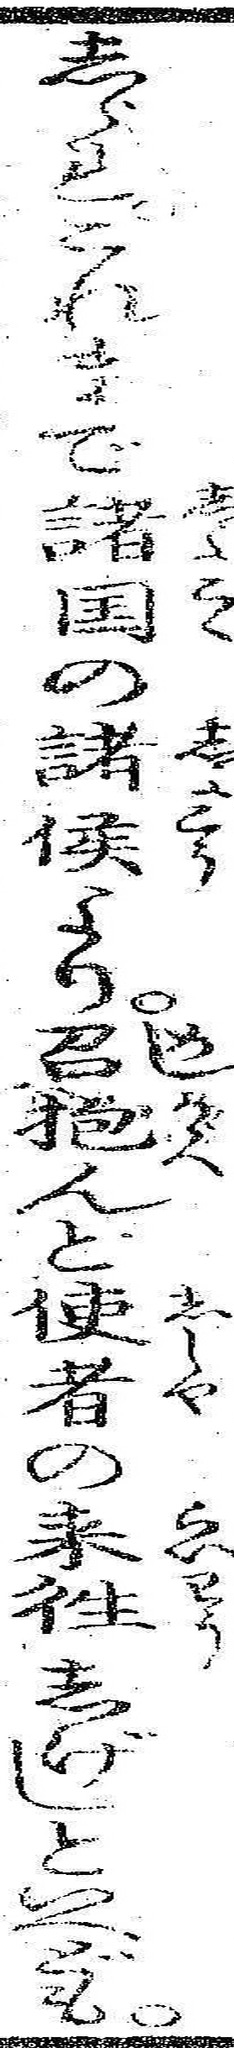しられ。これまで諸国の諸侯より。召抱んと使者の来往しげしといへども。
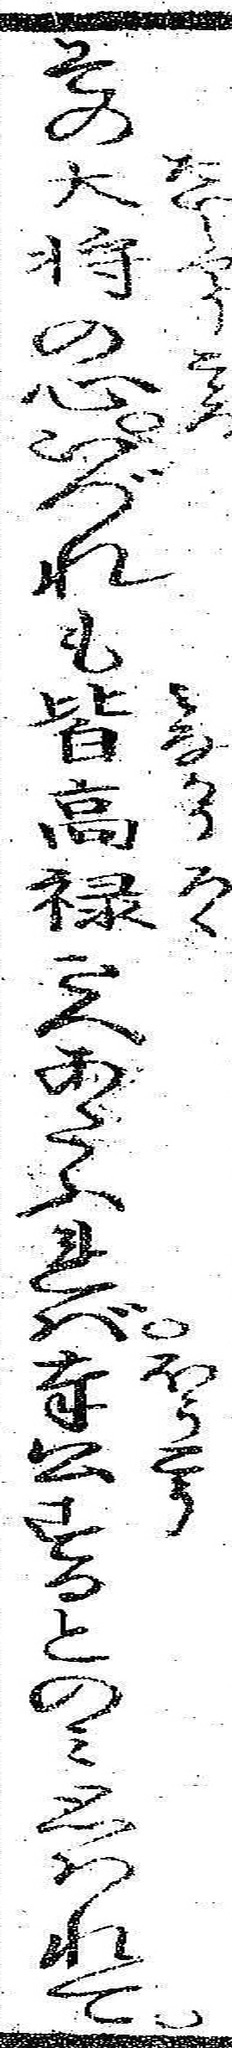その大将の心。いづれも皆高禄さへあたふれば。奉公するとのみ思はれて。
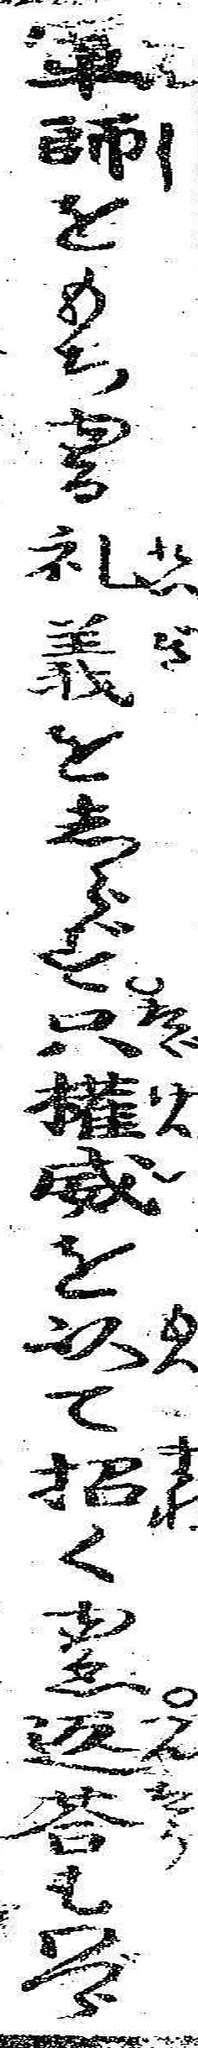軍師をもちゆる礼義をしらず。只権威を以て招くゆゑ。返荅もわづら
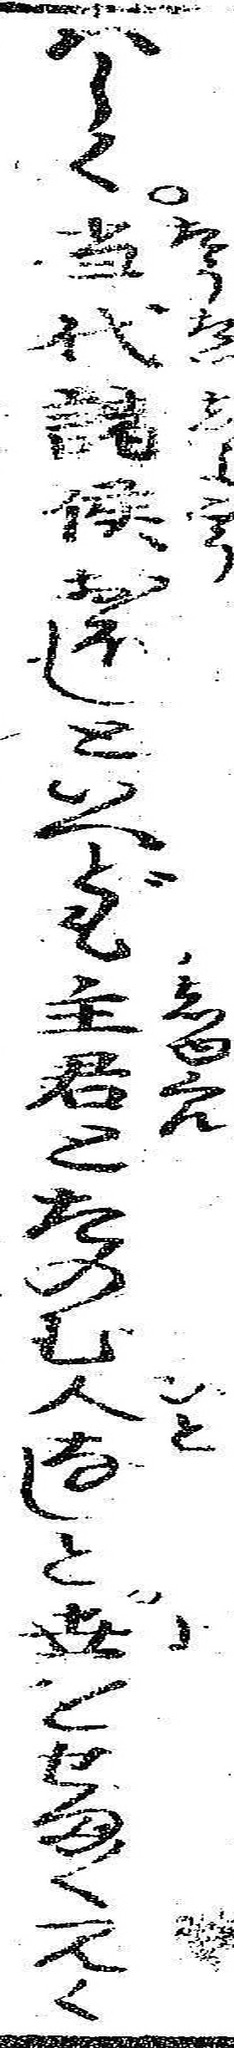はしく。当代諸侯おほしといへども主君とたのむ人なしと。世をせまく見く
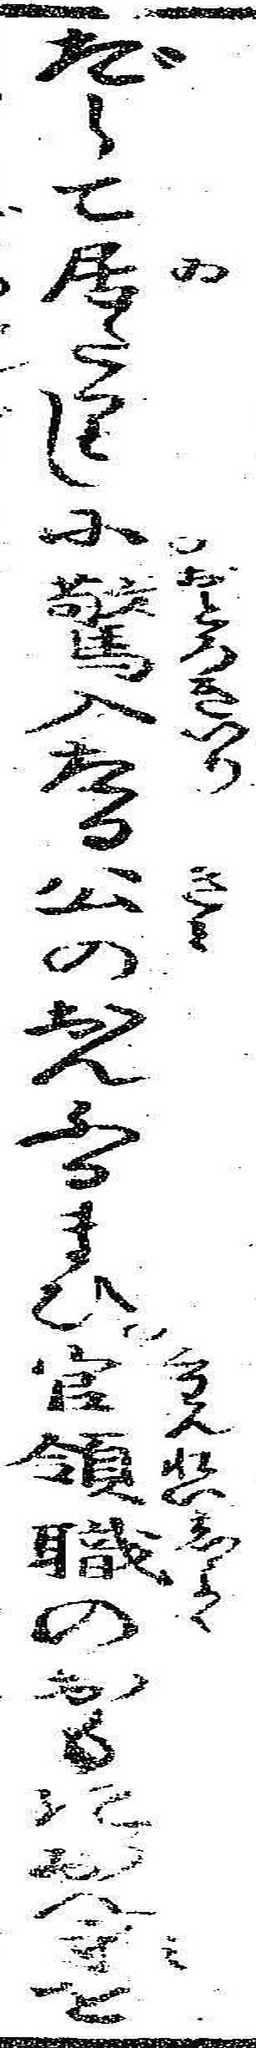だして居たりしに。驚入たる公のおんふるまひ。官領職のおもきおん身を
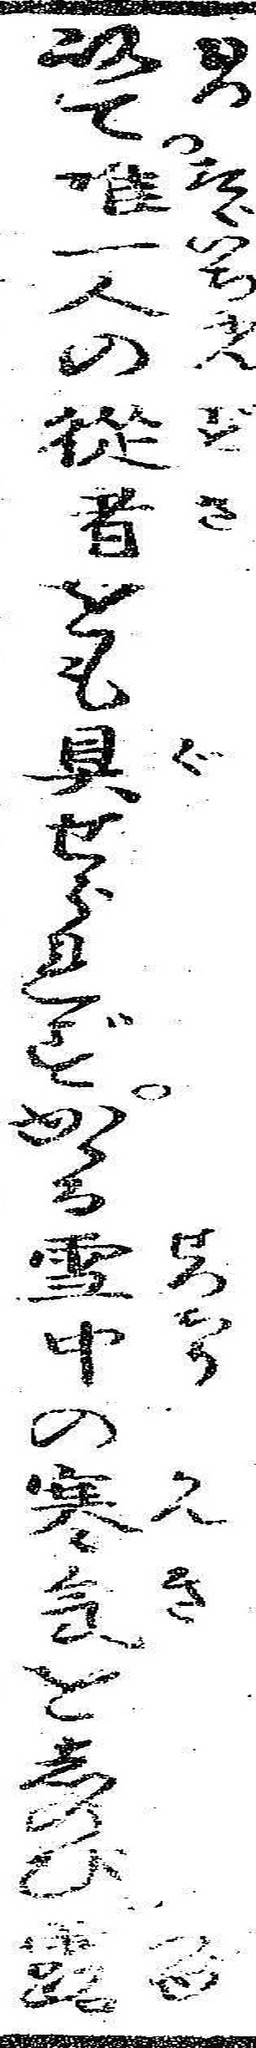以て。唯一人の従者をも具せられず。かゝる雪中の寒気をしのび。露
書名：昔話稲妻表紙
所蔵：国文学研究資料館
